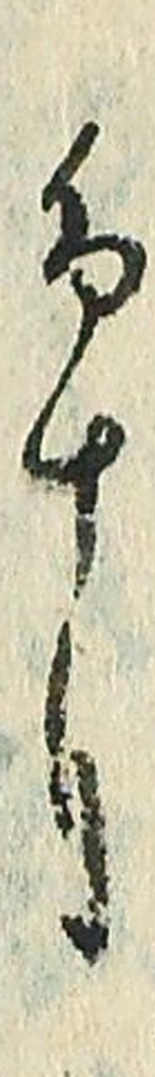卯十月
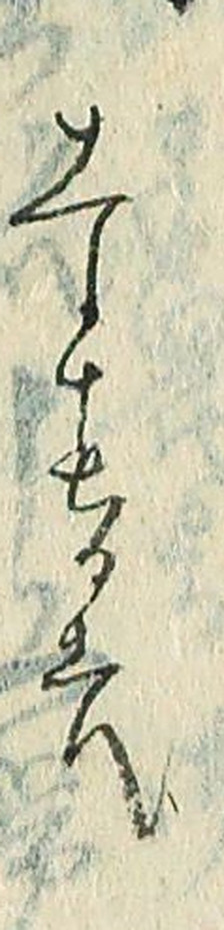十一月十七日上る
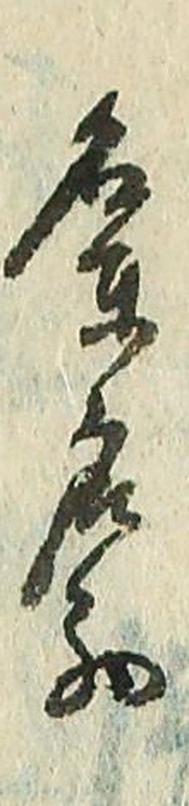名東名西
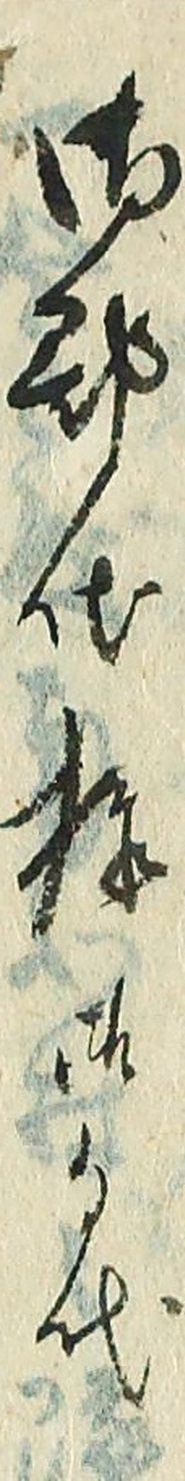御郡代様御手代
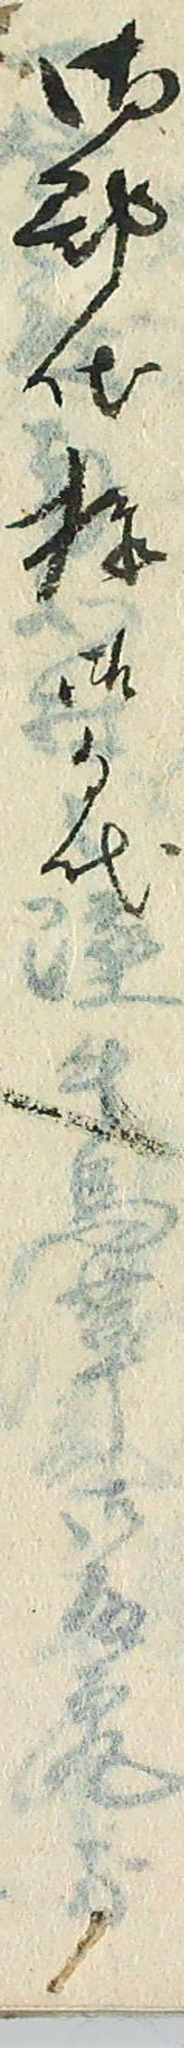御郡代様御手代
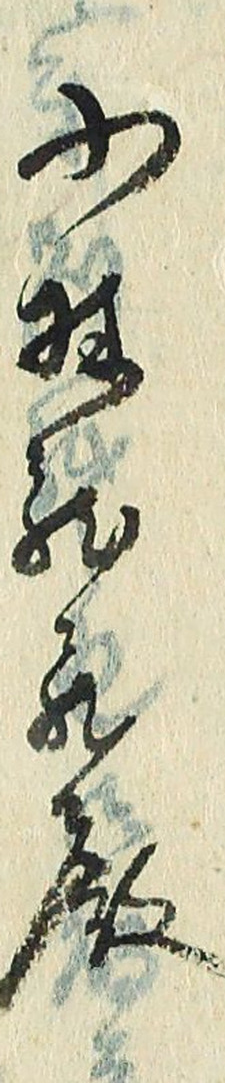小林龍蔵殿
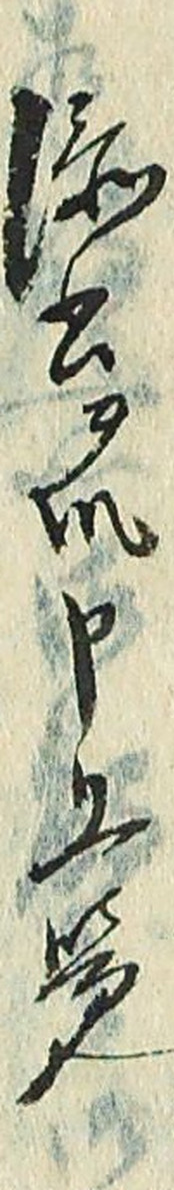添書を以申上覚
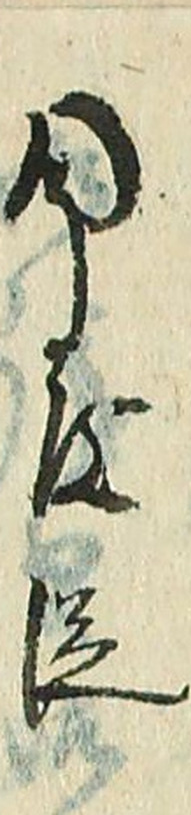今度従
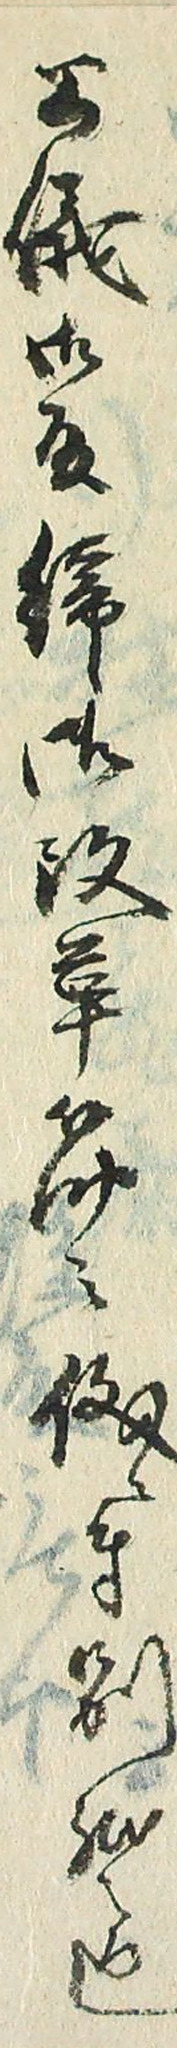公儀御取締御改革筋之儀に付別紙之通
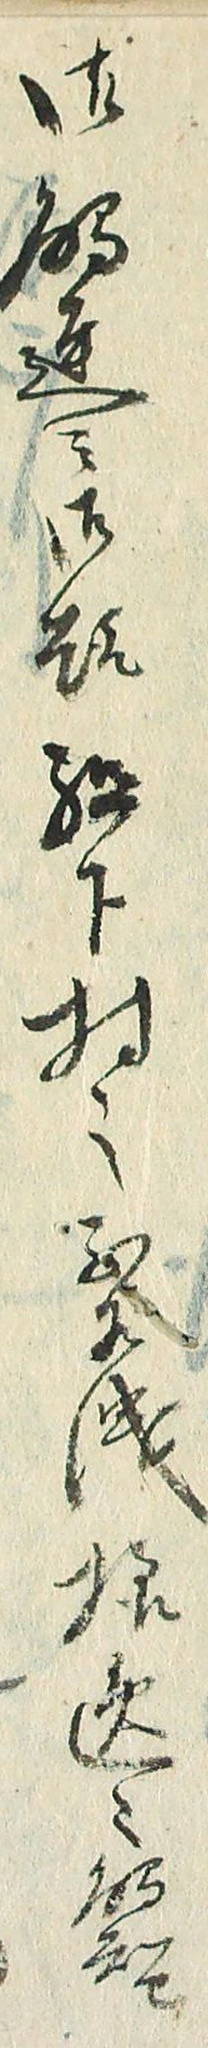御触達之御趣組下村々不相洩様逸々触知せ
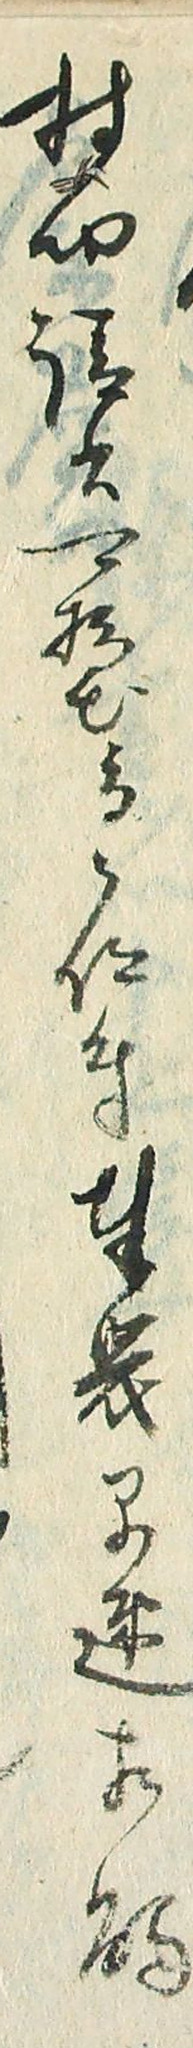村切請書可指出旨被仰付奉畏早速相触
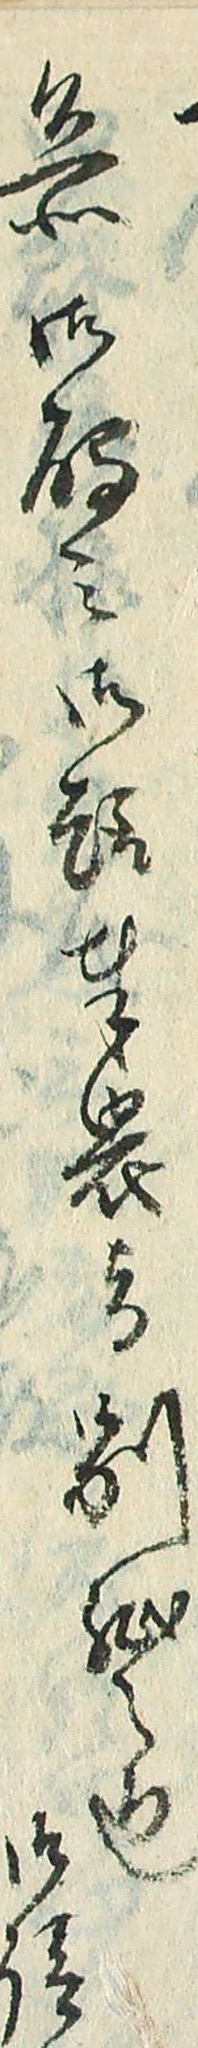候所御触之御趣奉畏旨別紙之通

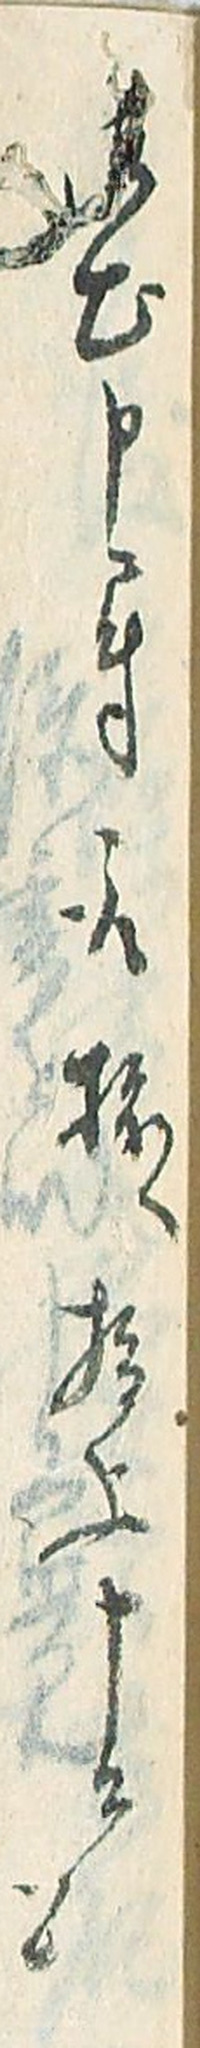出申に付取揃へ指上申候以上
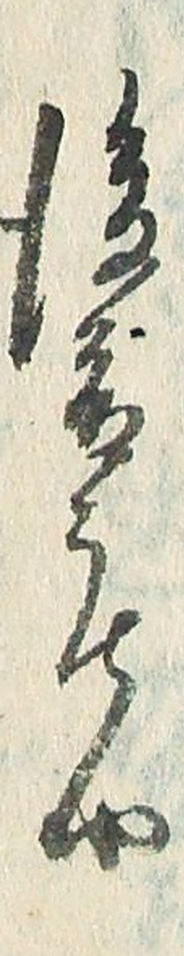後藤庄助
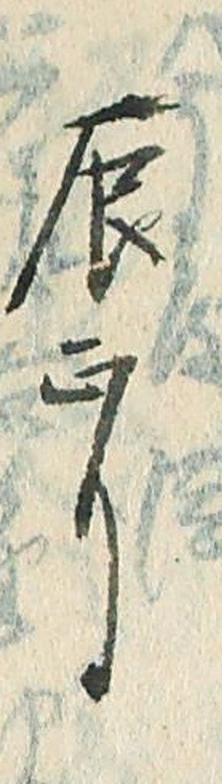辰正月
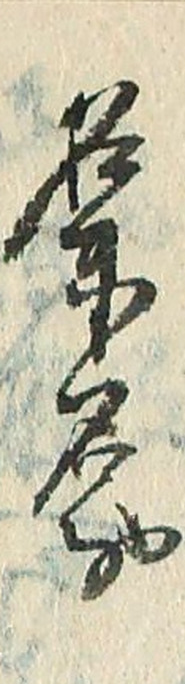名東名西
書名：諸御用御□受書控
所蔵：鳴門教育大学 Naruto University of Education
